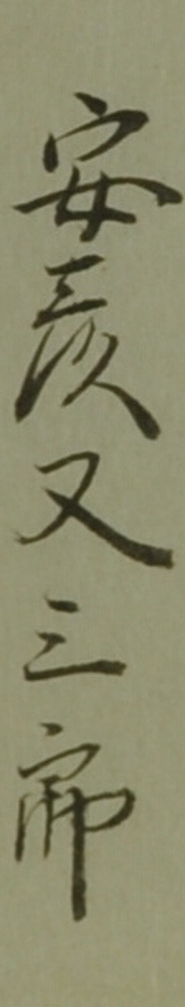安彦又三郎

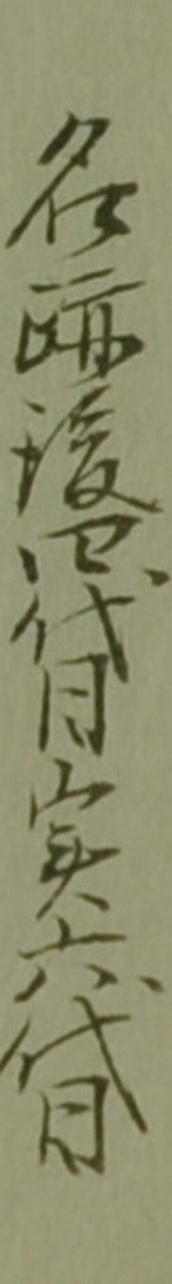名跡後四代目実六代目
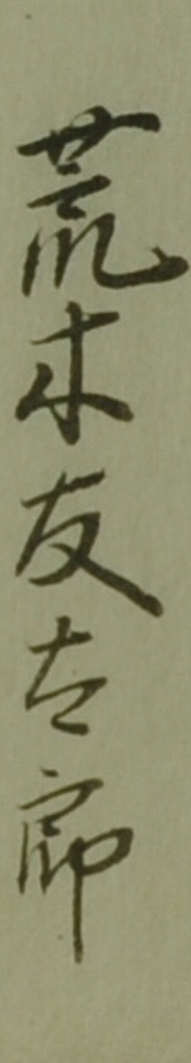荒木友太郎
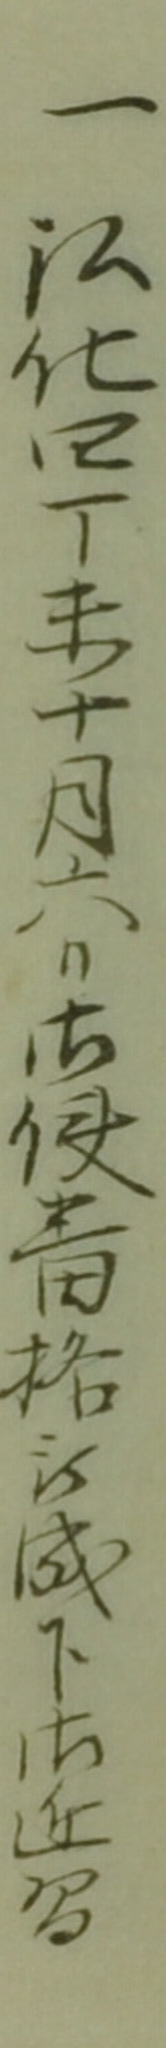一弘化四丁未十月六日御使番格被成下御近習
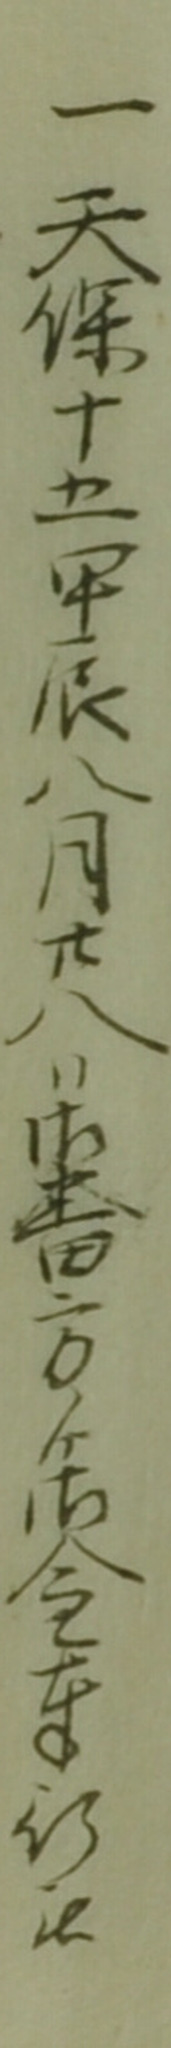一天保十五甲辰八月廿八日御番方ゟ御金奉行被
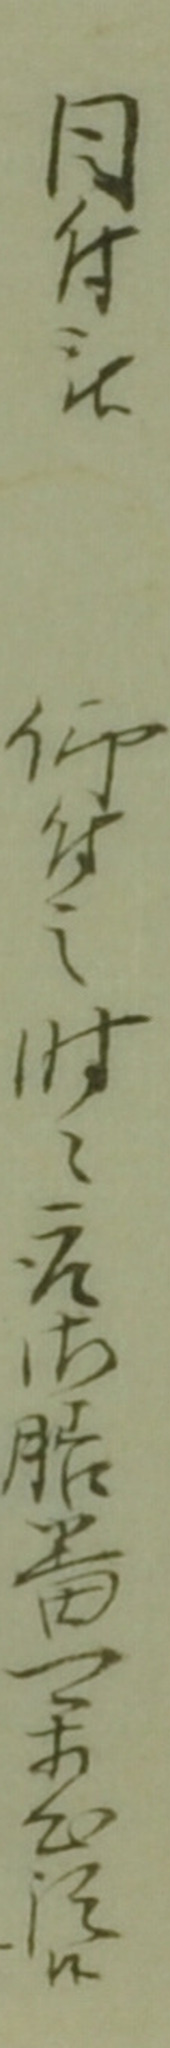目付被仰付之時々取御膳番可相心得候
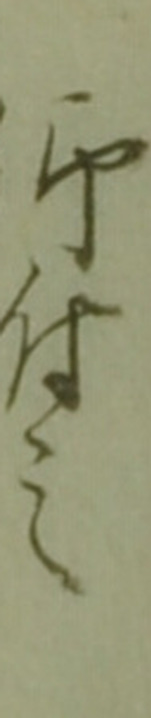仰付之
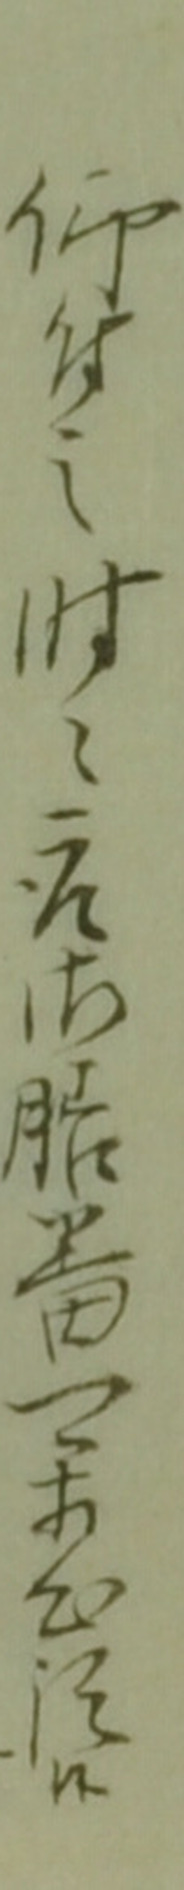目付被仰付之時々取御膳番可相心得候
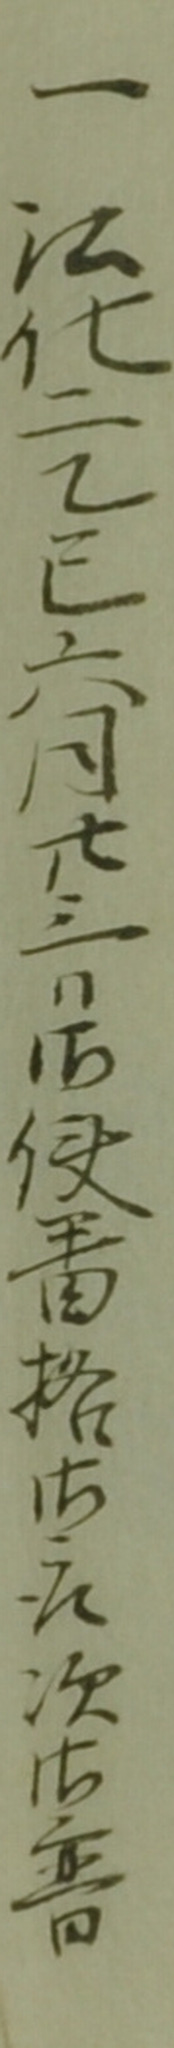一弘化二乙巳六月廿三日御使番格御取次御普
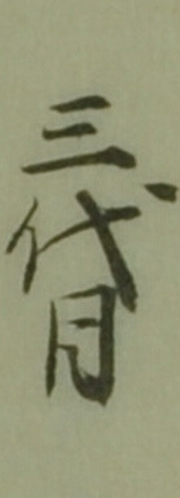三代目
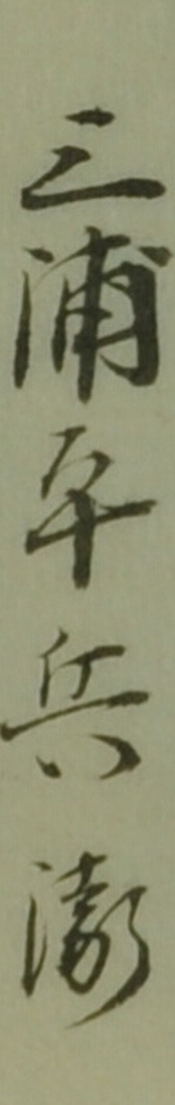三浦平兵衛
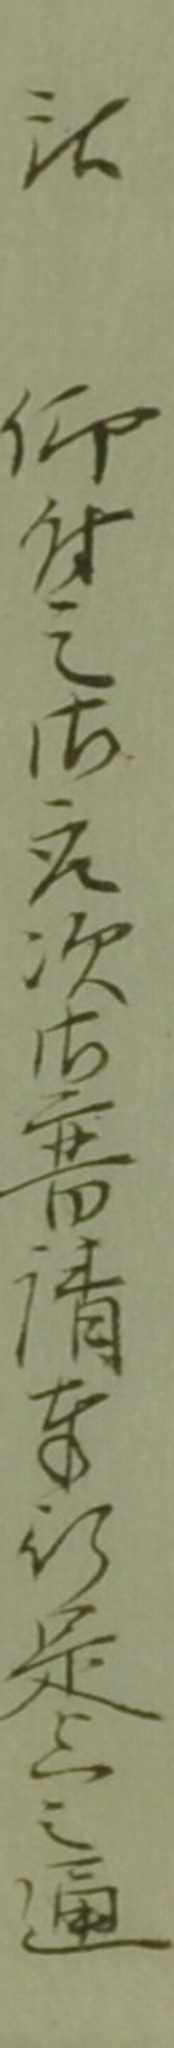被仰付之御取次御普請奉行是迄之通
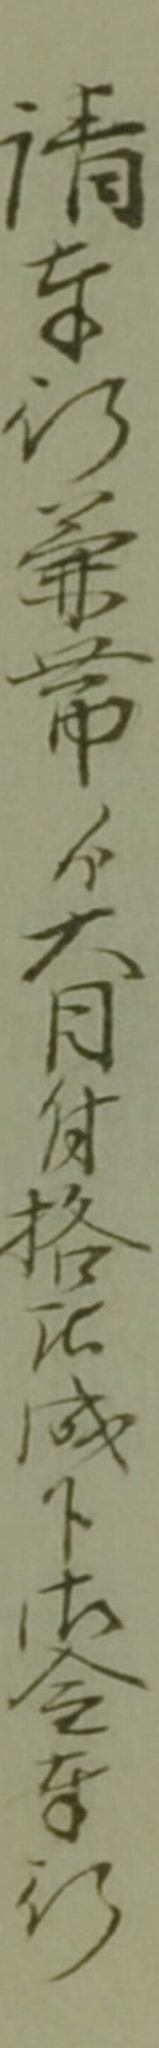請奉行兼帯ゟ大目付格被成下御金奉行
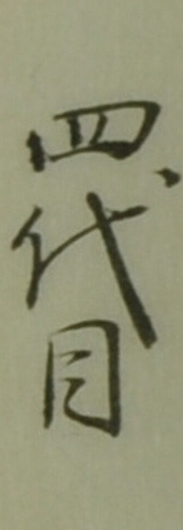四代目

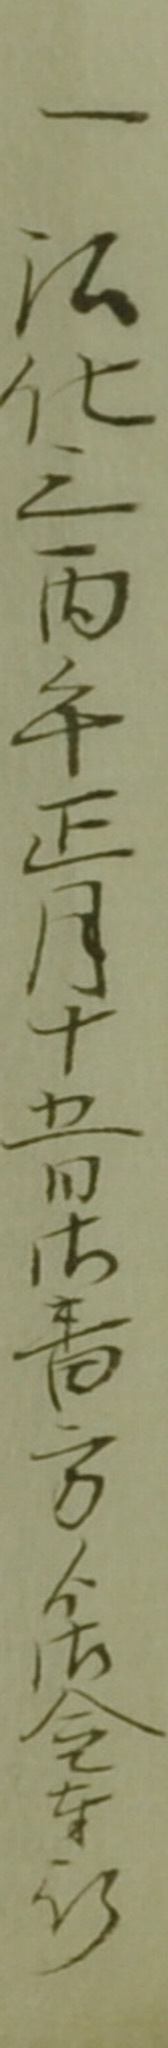一弘化三丙午正月十五日御番方ゟ御金奉行
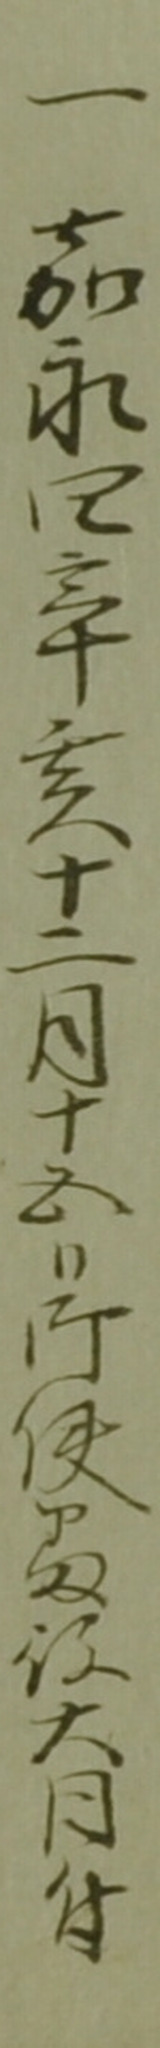一嘉永四辛亥十二月十五日御使番役大目付
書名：諸御役代々録（七）
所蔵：伊那市立高遠町図書館・合同会社AMANE
